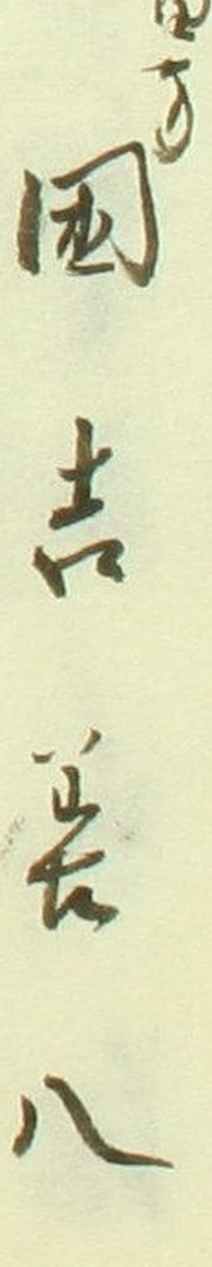国吉善八
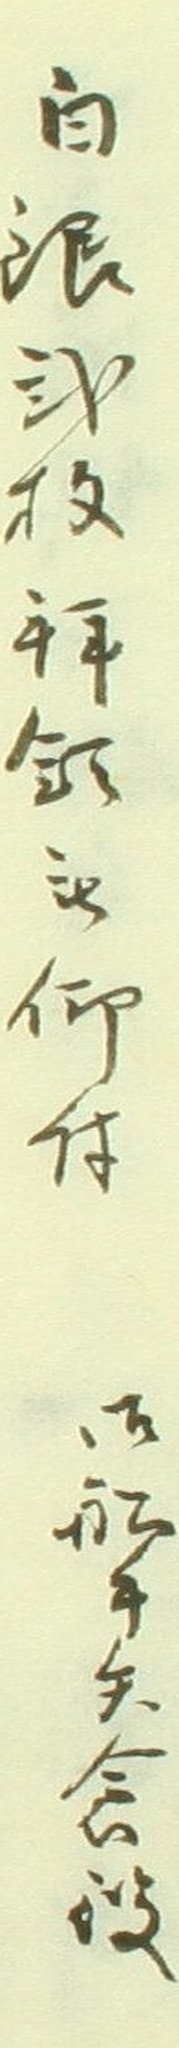白銀弐枚拝領被仰付御船手矢倉役
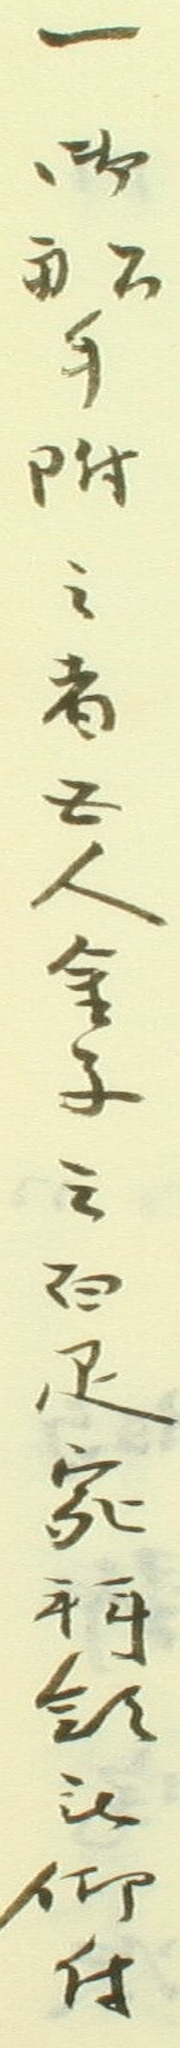一御船手附之者五人金子百疋宛拝領被仰付
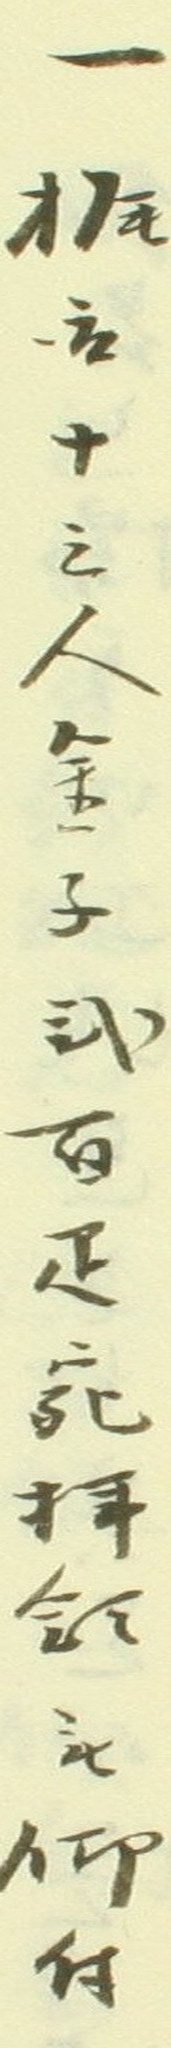一梶取十三人金子弐百疋宛拝領被仰付
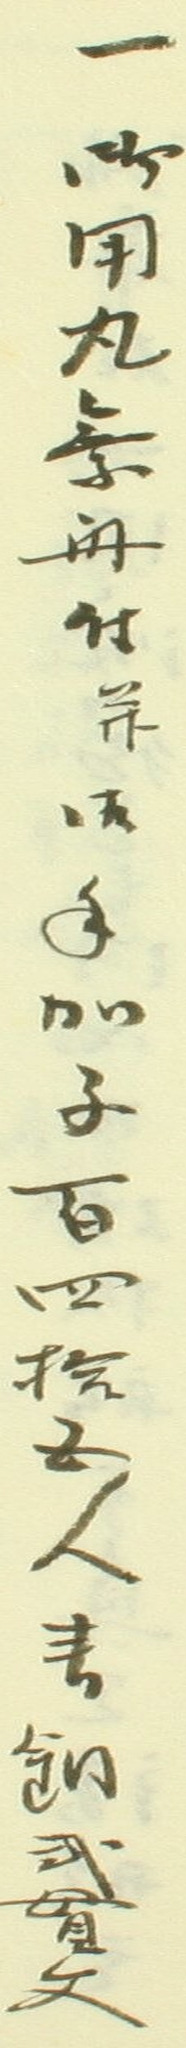一御用丸の乗舟付並御手加子百四拾五人青銅弐貫文
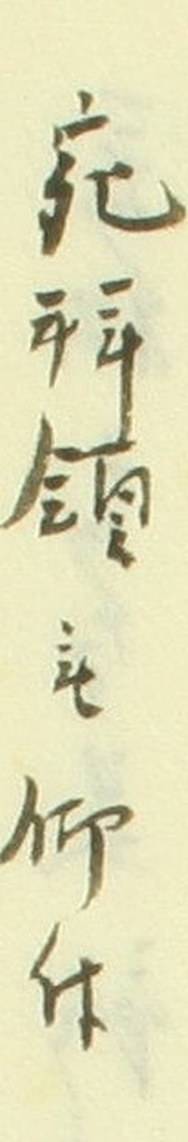宛拝領被仰付
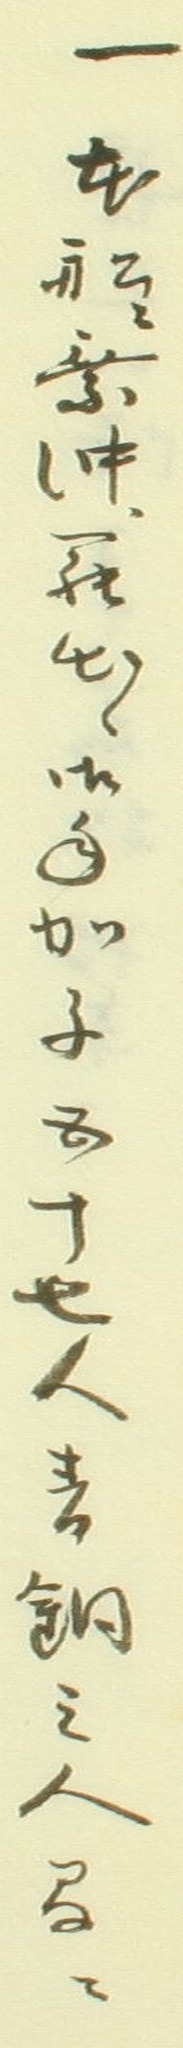一本船に乗沖へ罷出候御手加子五十七人青銅之人間に
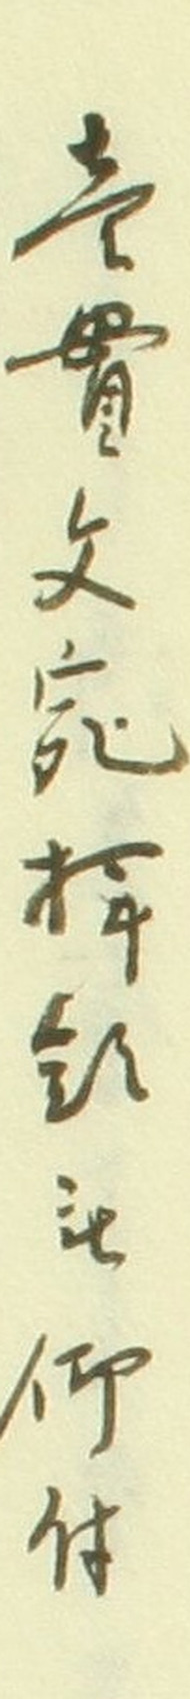壱貫文宛拝領被仰付
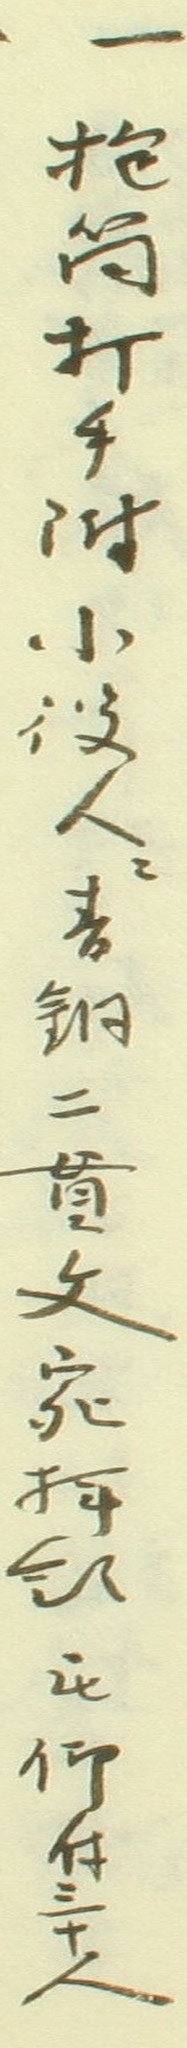一抱筒打手附小役人に青銅二貫文宛拝領被仰付三十人
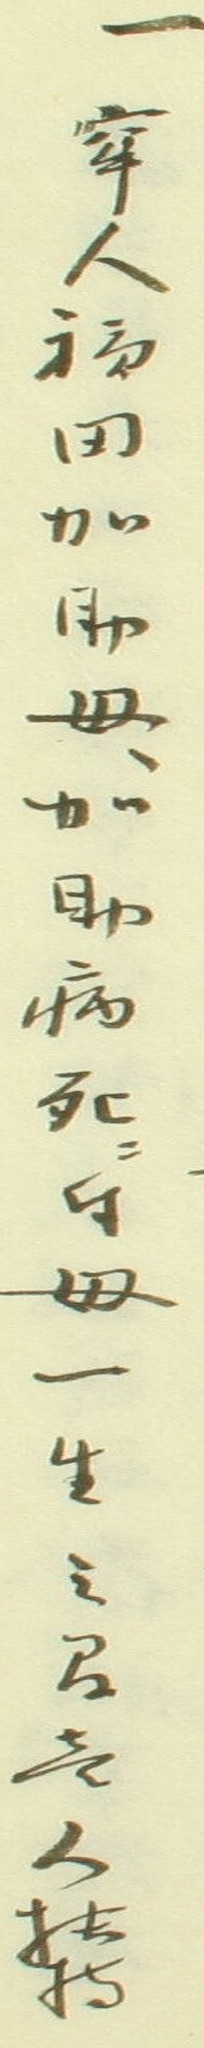一牢人福田加助母へ加助病死に付母一生之間壱人扶持
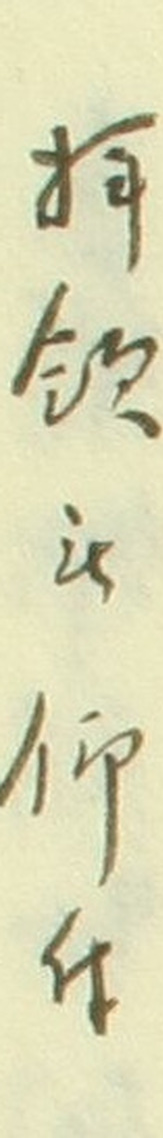拝領被仰付
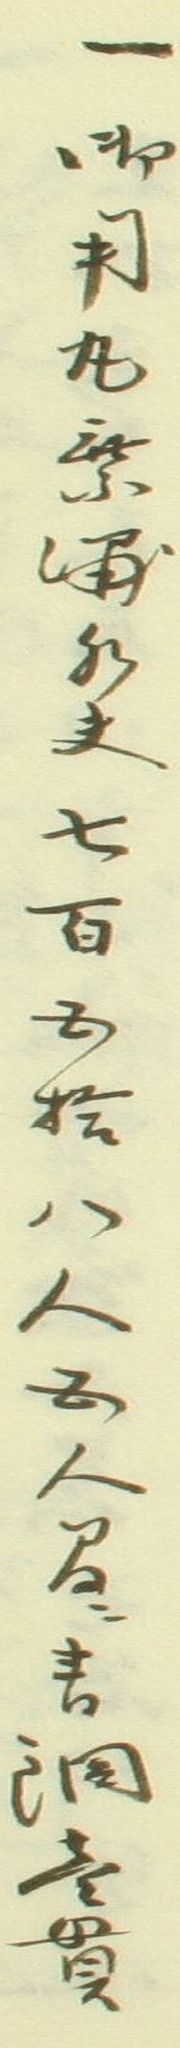一御用丸乗浦水夫七百五拾八人五人間に青銅壱貫
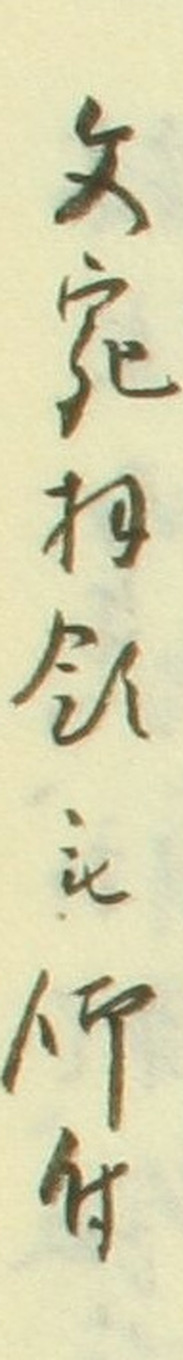文宛拝領被仰付

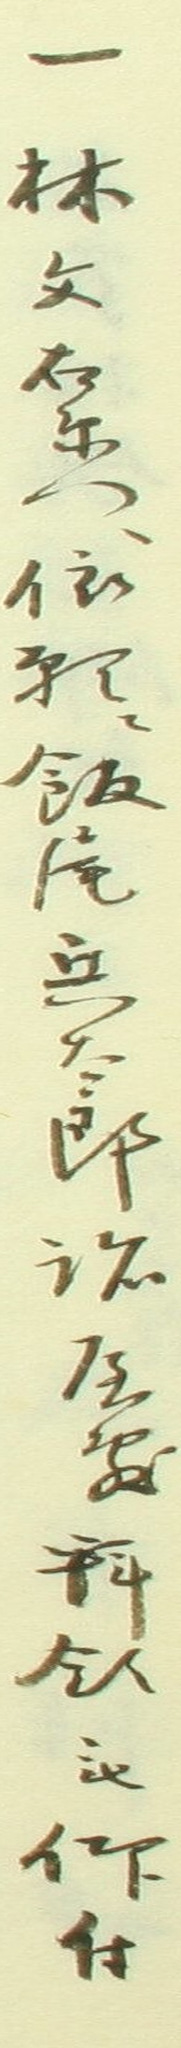一林文右衛門へ依頼に飯尾兵太郎諸屋敷拝領被仰付
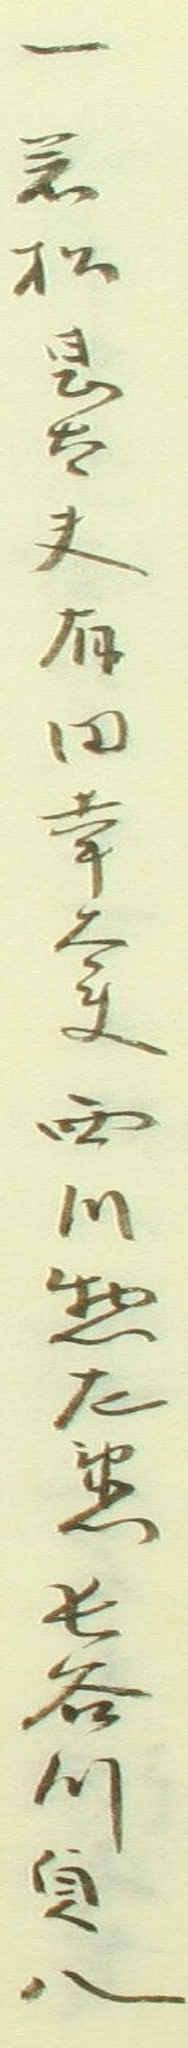一若松甚太夫有田幸太夫西川惣左衛門長谷川貞八
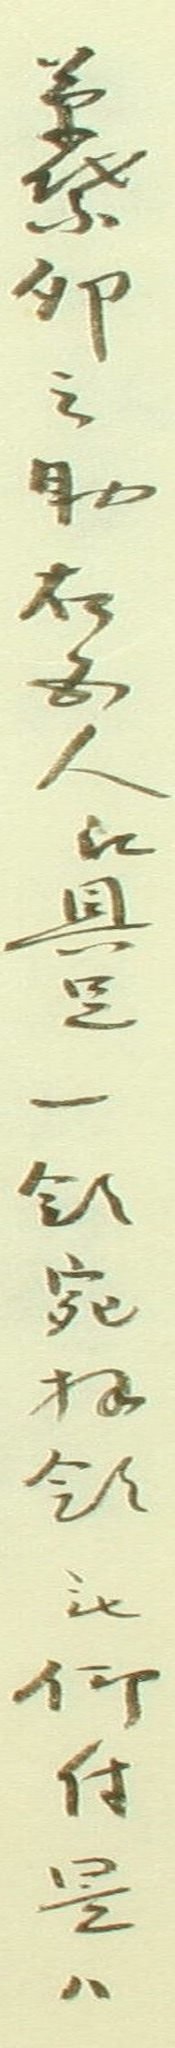草葉卯之助右五人江具足一領宛拝領被仰付是は
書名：唐船漂流記 三
